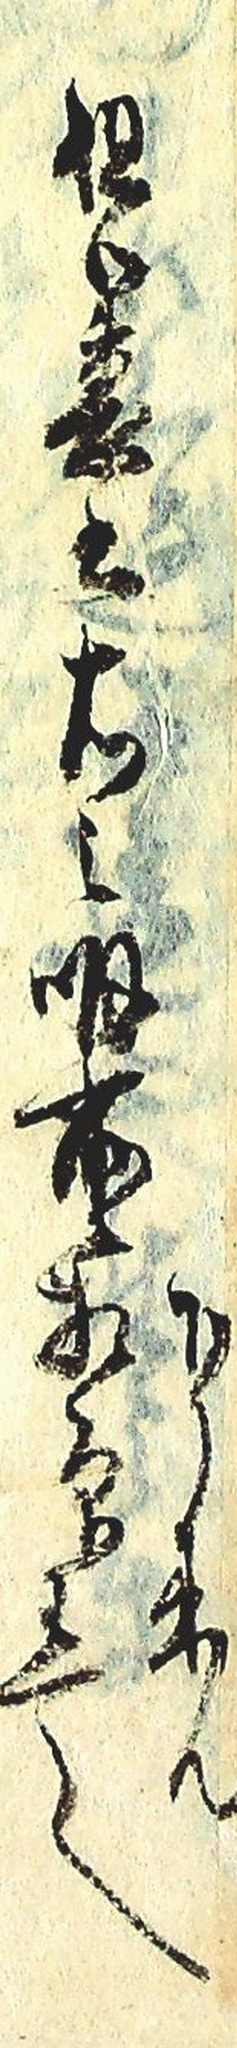但御裏書右之明所に相印有之
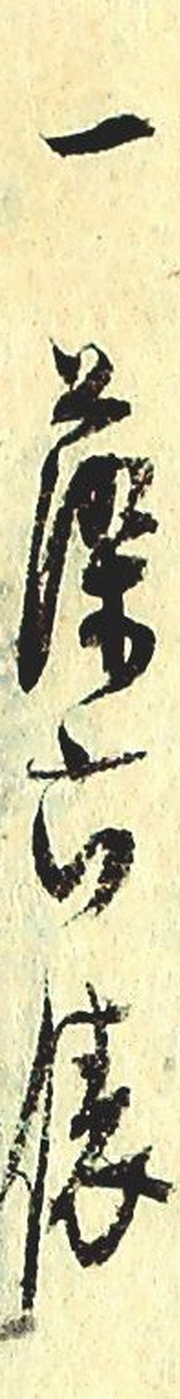一蒅六俵
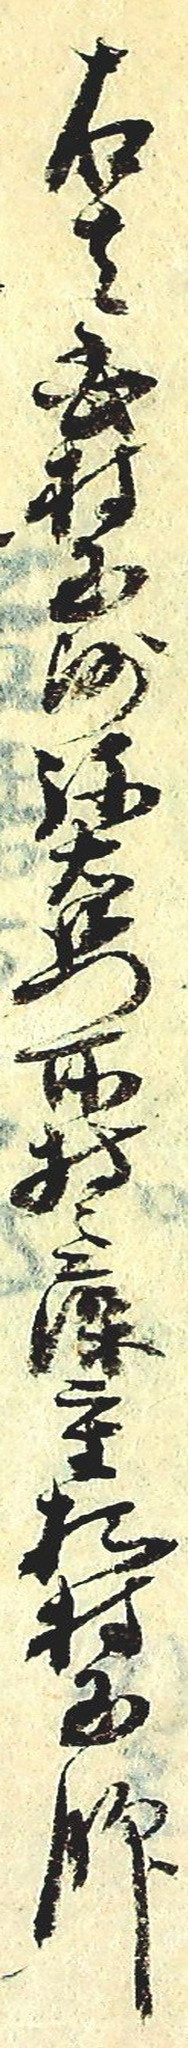右は当村玉師弥右衛門所持之蒅重松村玉師
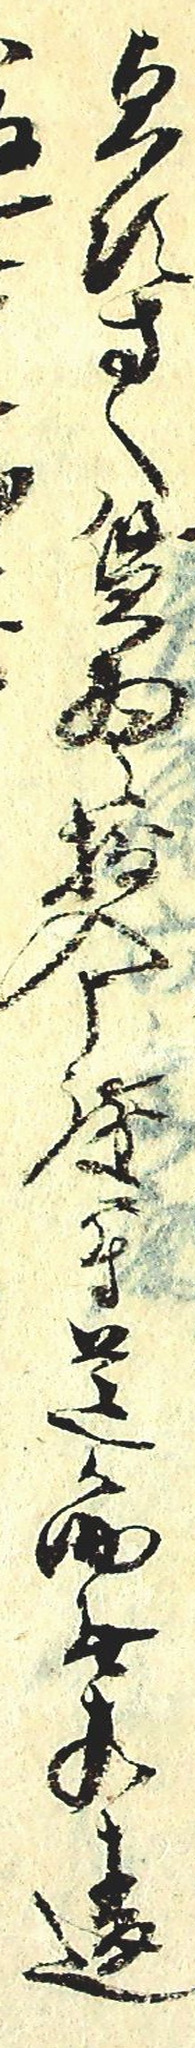貞次方へ質物に指入度に付道筋無相違
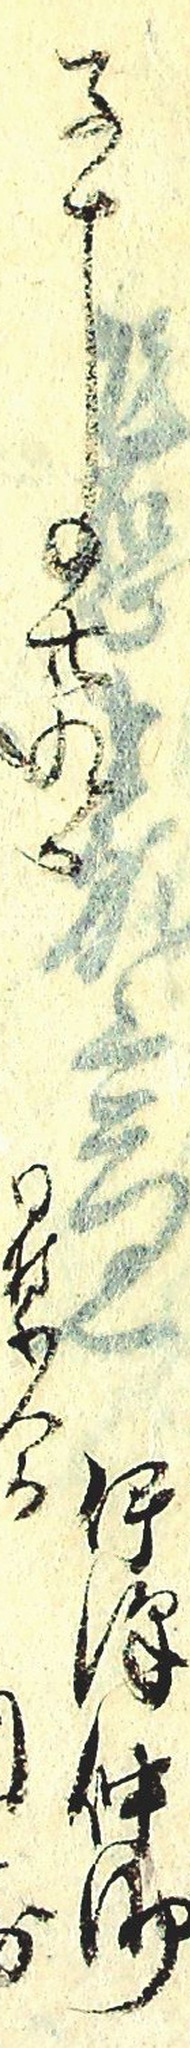子十月廿九日同村五人与
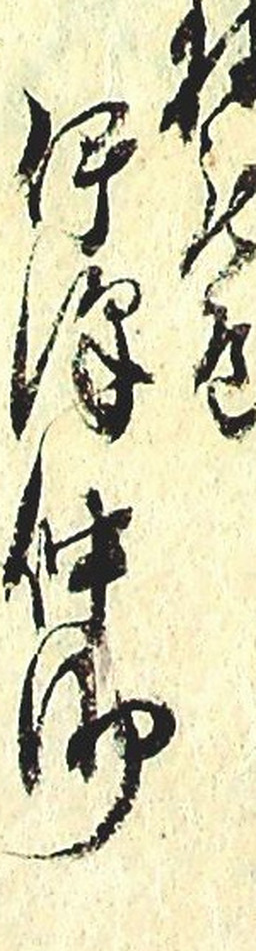伊沢仲助
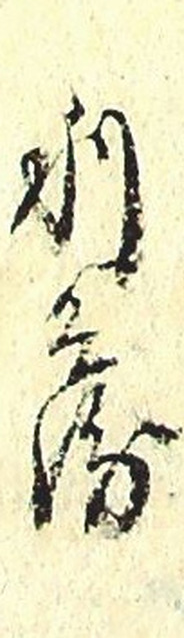利兵衛
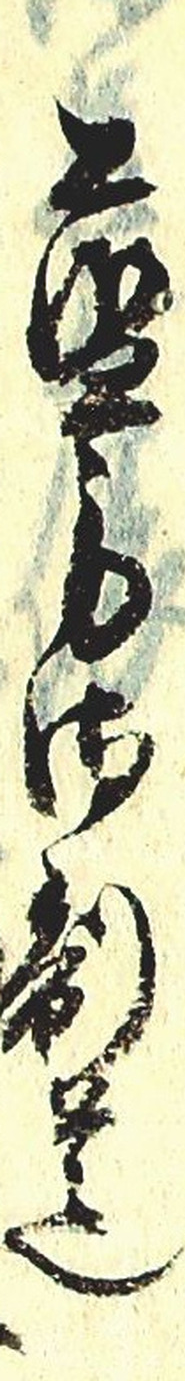藍方御制道
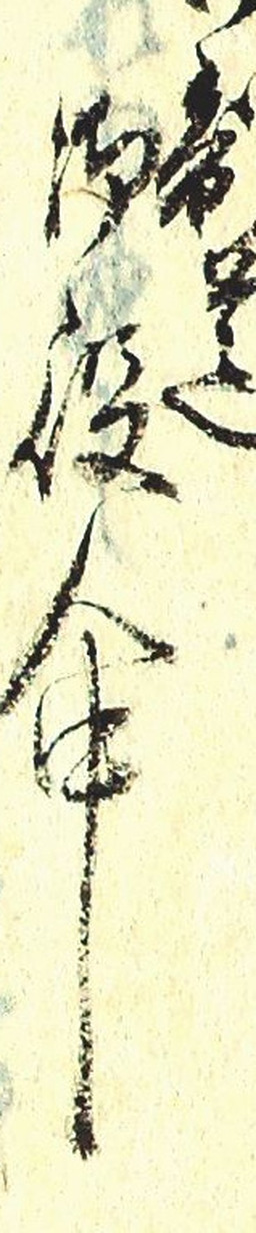御役人中
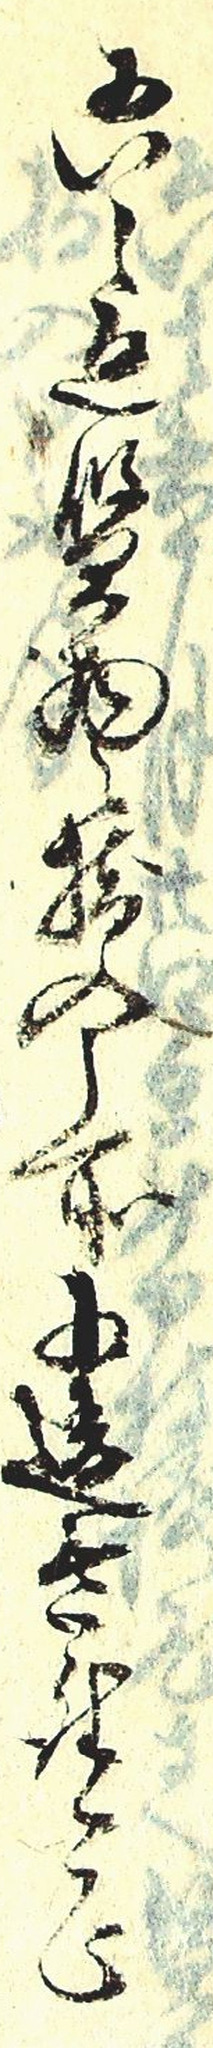右之通質物に指入申所相違無御座候以上
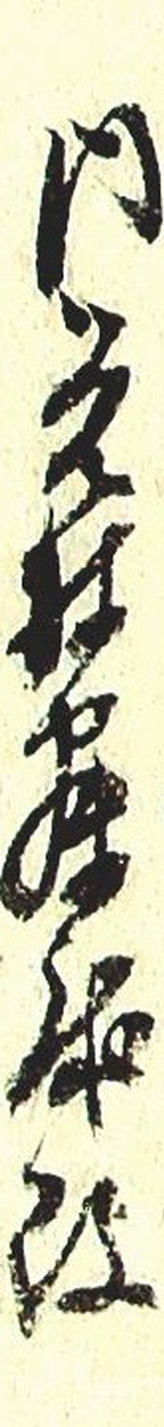内谷村寐床改
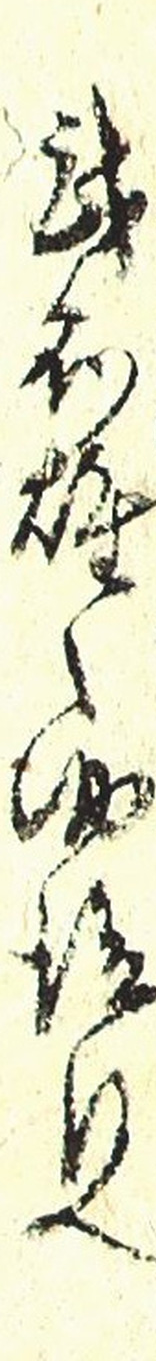武知雄之助後見
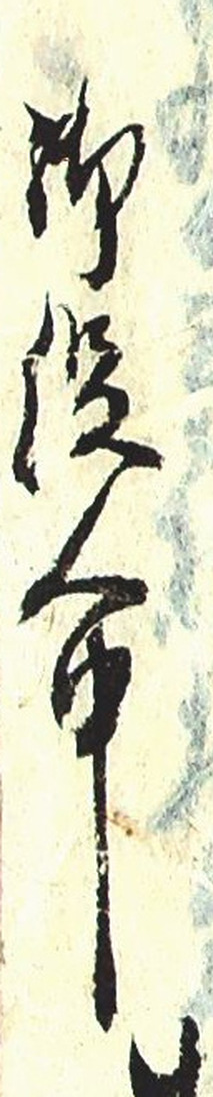御役人中
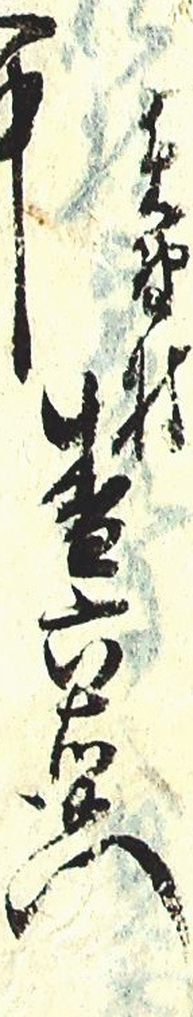盛六右衛門
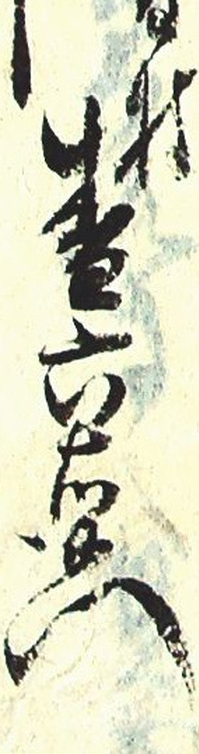盛六右衛門
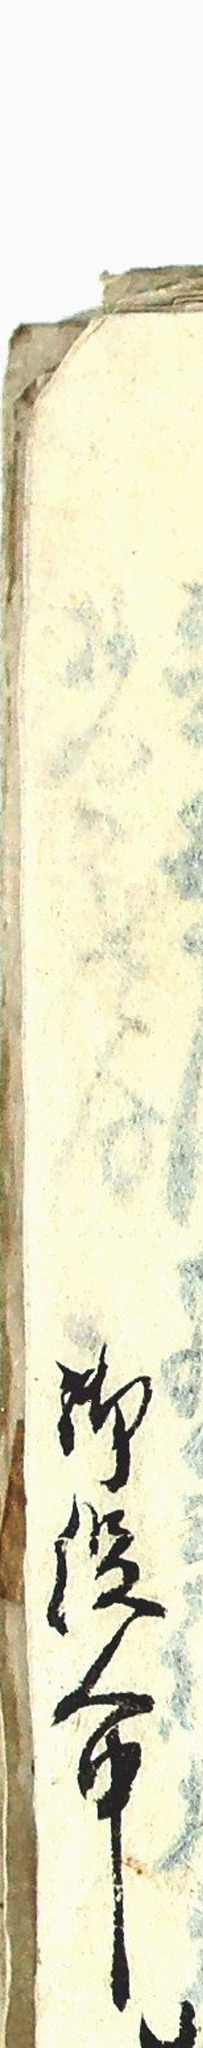御役人中
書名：諸御願書控(弐番）
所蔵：鳴門教育大学 Naruto University of Education
